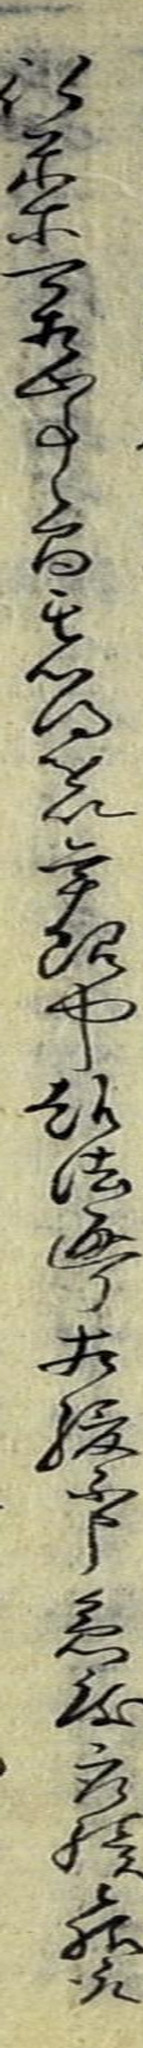行米等可相止事候間其心得を以年限中趣法通り相緩不申急度取続候様取
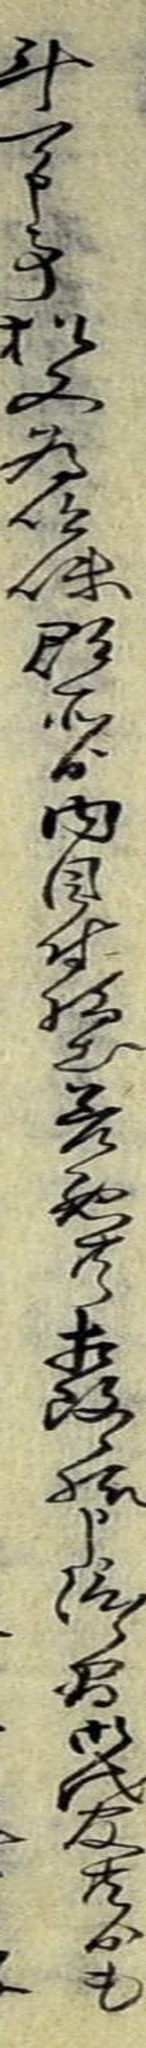斗可申事猶又為吟味郡所ゟ内目付指出善悪共相改候様申渡候間御代官共ゟも
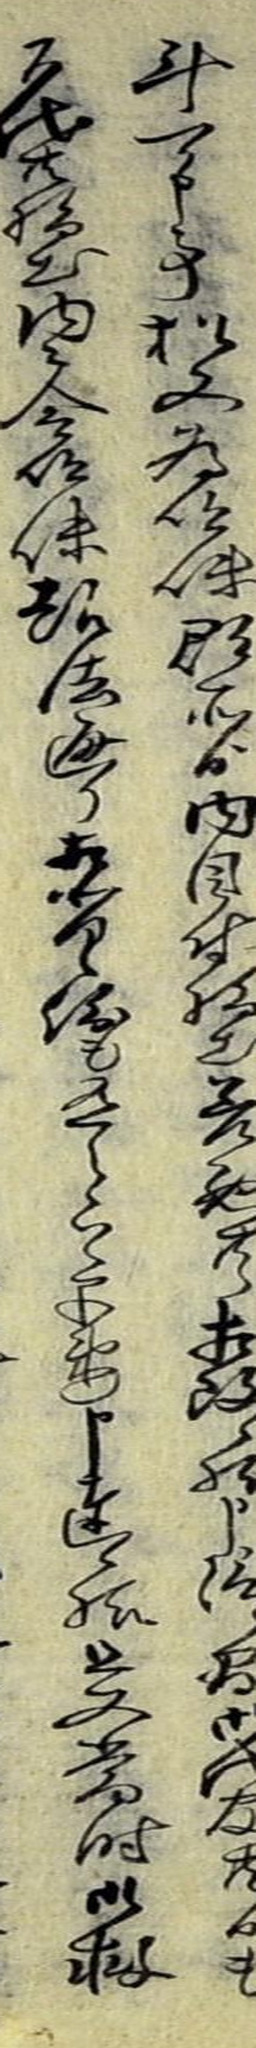下代共指出内々令吟味趣法通り相背候儀も有之候はゝ早速申達候様且又当時御救
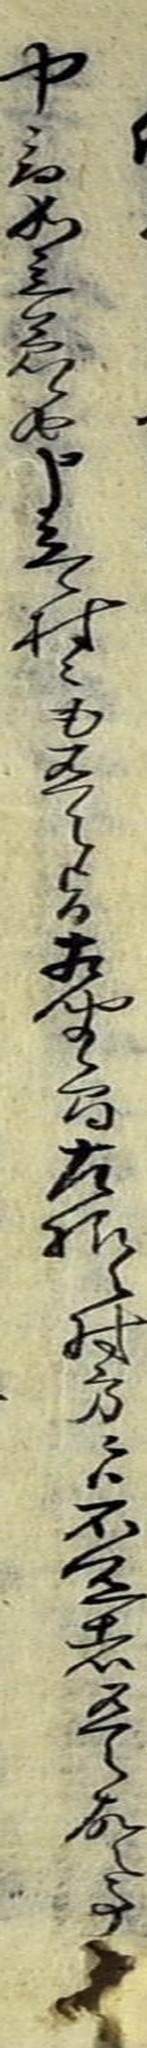中に而成立兼候由申立候村々も有之旨相聞候間左様之村方には不宜者有之故之事
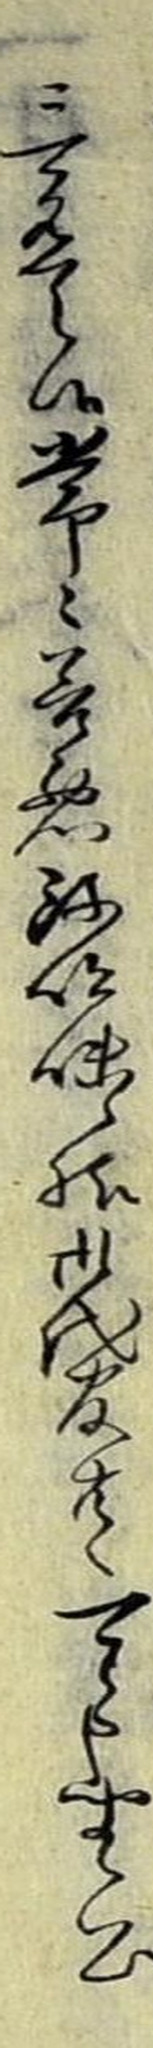に可有之候常々善悪致吟味候様御代官共へ可申聞候以上
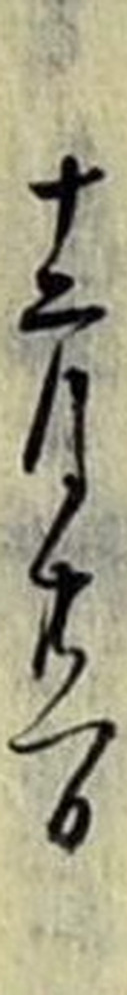十二月廿一日
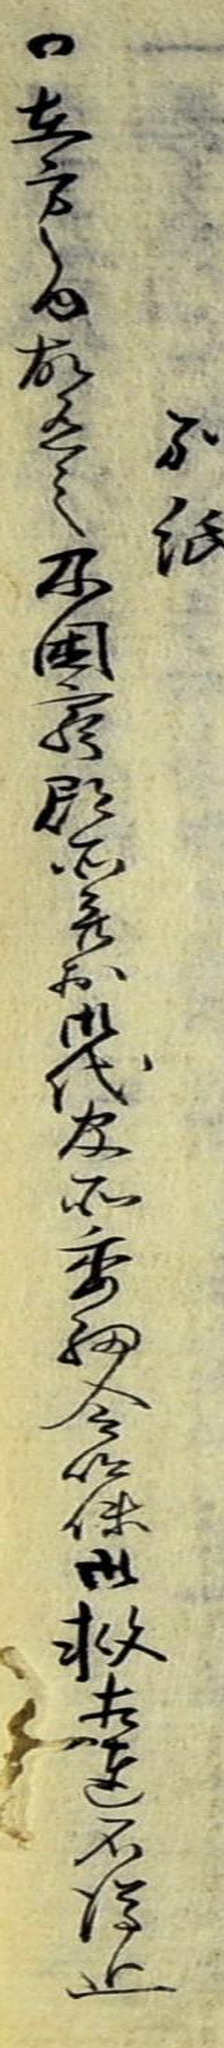〇在方之内故有之及困窮郡所并於御代官所委細令吟味御救相達不得止

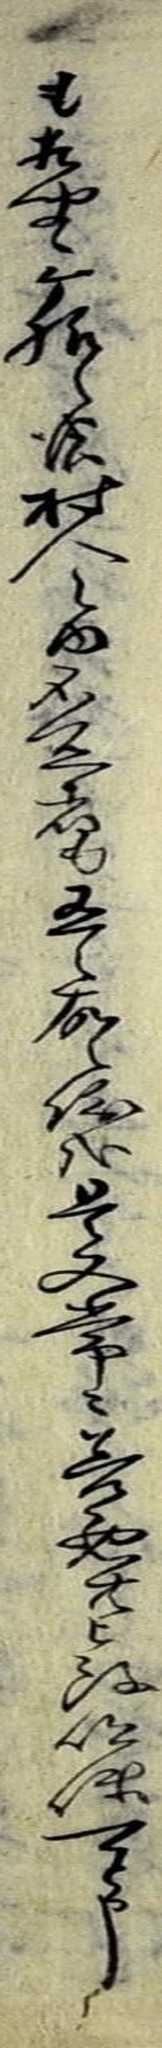も相聞候ケ様之儀は村人之内不宜者も有之故之儀哉是又常々善悪共被致吟味可被申
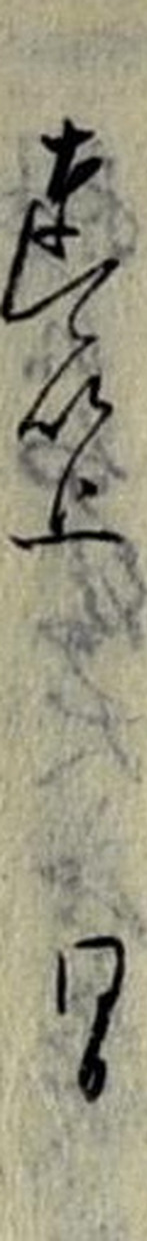達候以上同日
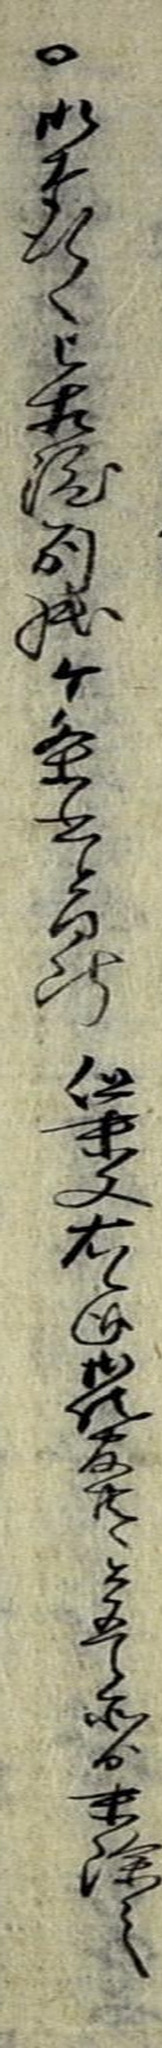〇御奉行へ被相渡別紙ヶ条書と同断但末文右之趣御代官共へと有之所ゟ末除之
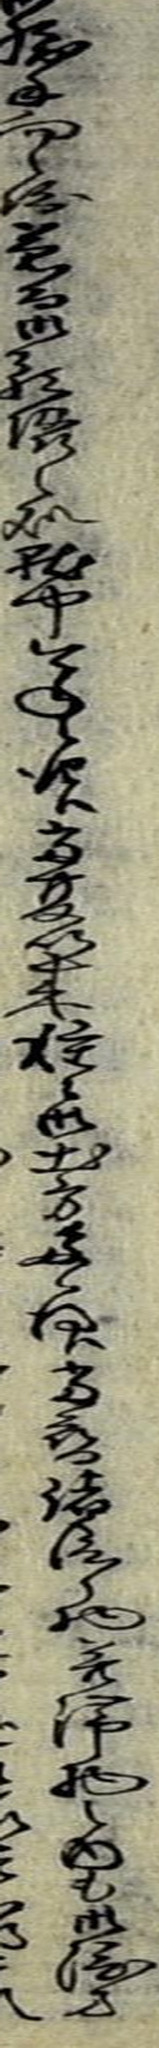〇御勝手向之儀兼而難渋之処就中今年之儀は当夏以来種々御出方多候得は当暮諸渡り物并滞物之内も御勝手方
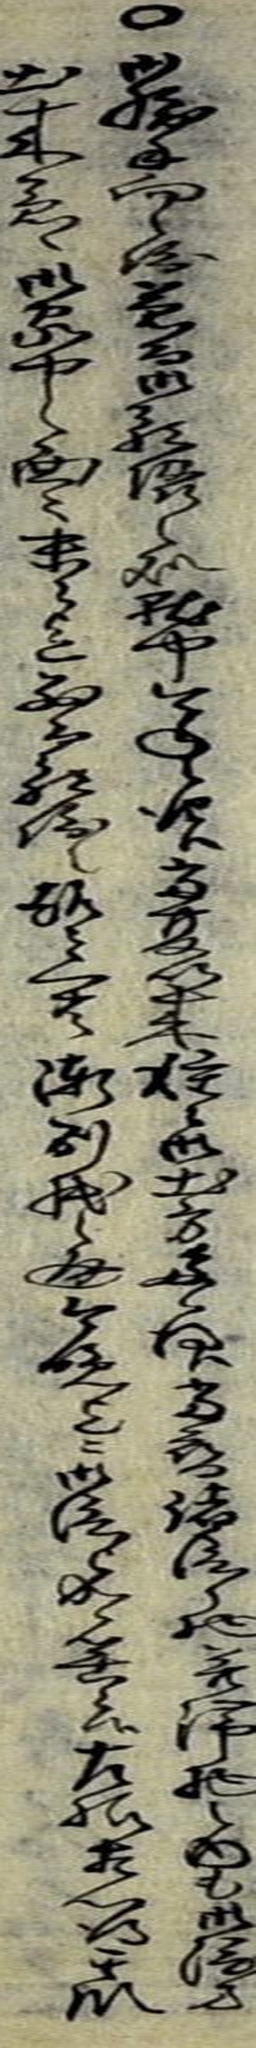出来兼候御家中之面々末々迄別而難儀之趣に候へ共漸別紙之通今晩迄に御渡被成候筈に候左様相心得其段
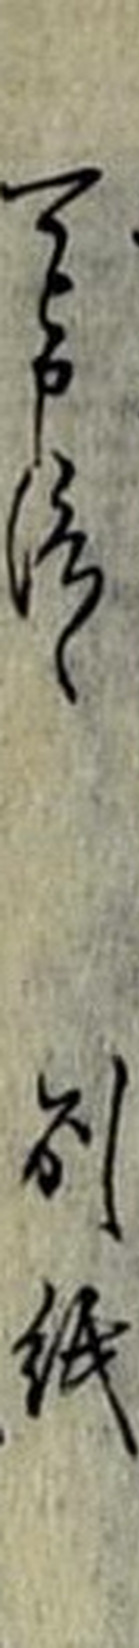可被申渡候別紙
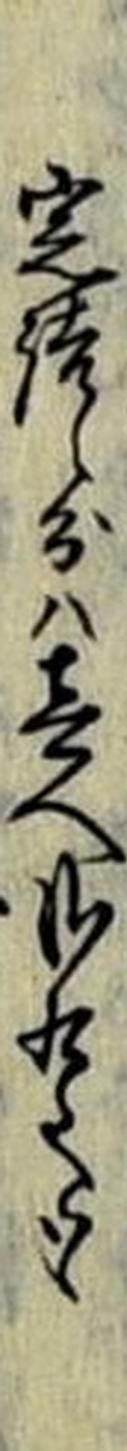定詰之分は壱人弐拾匁ツヽ
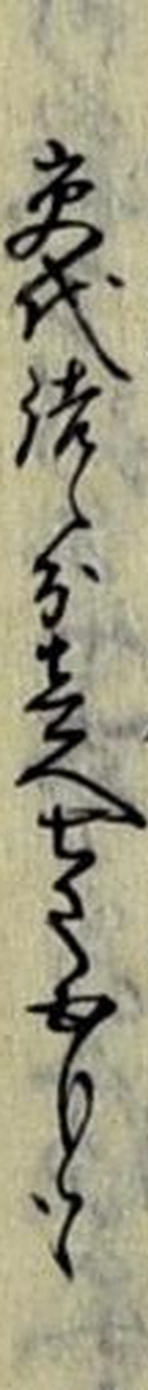交代詰之分壱人七匁五分ツヽ
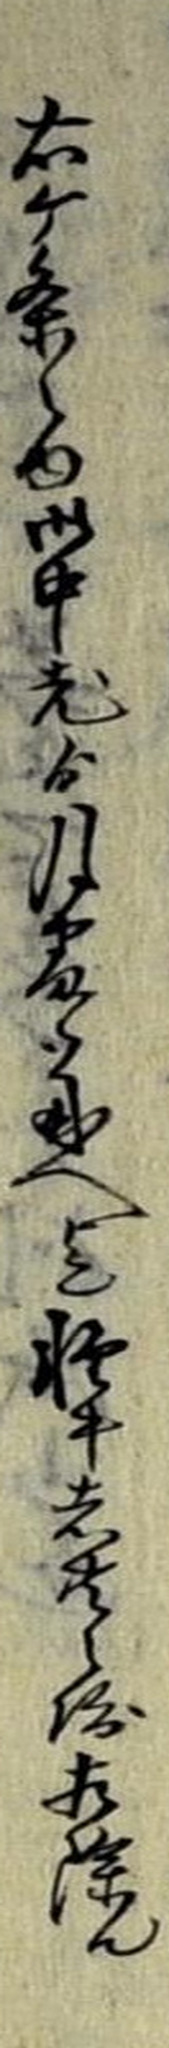右ケ条之内御中老ゟ月番御用人迄軽き者共之儀相除る
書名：命令之部 二
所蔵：福井県文書館 Fukui Prefectural Archives
